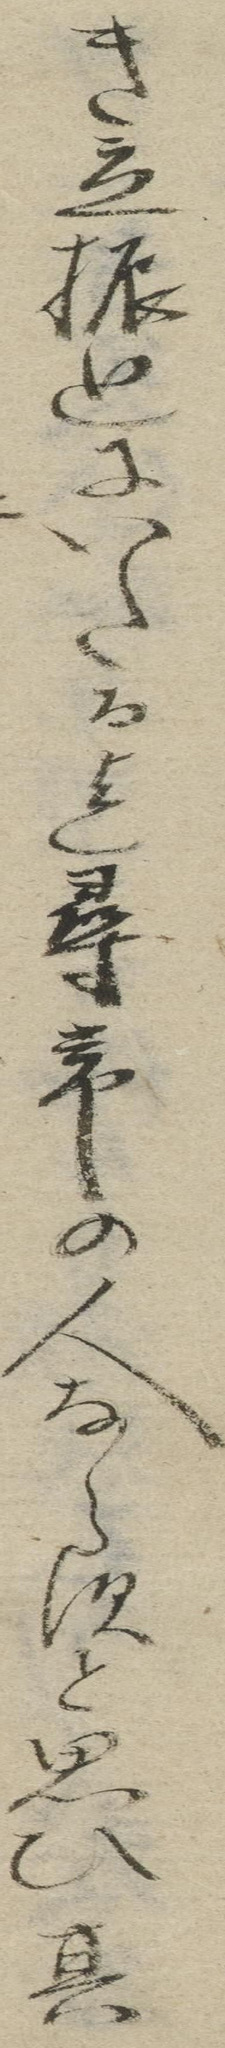き立振廻にいたる迄尋常の人ならすと思ひ其
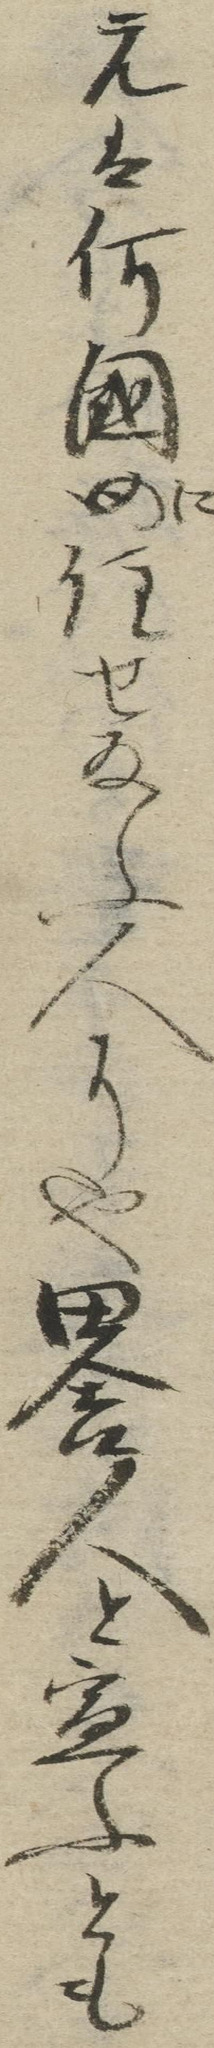元は何国の住せ給ふ人にや田舎人と宣ふとも

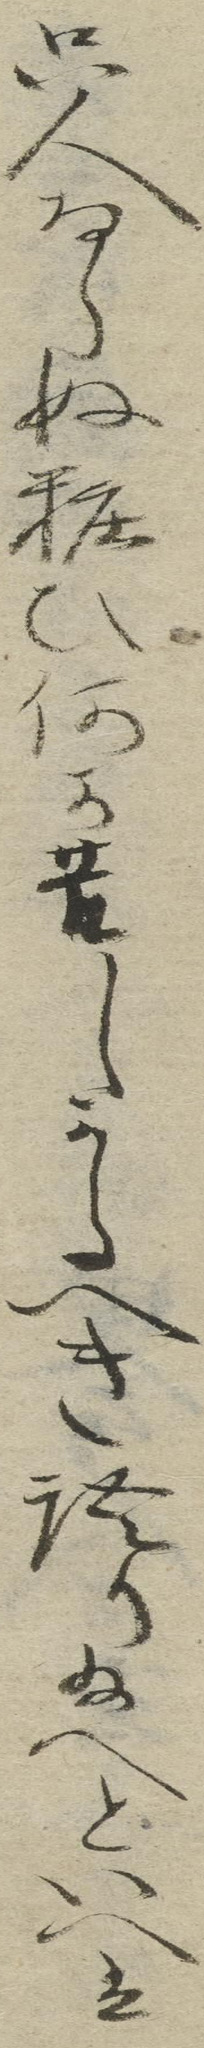只人ならぬ粧ひ何か苦しかるへき語り給へといへは
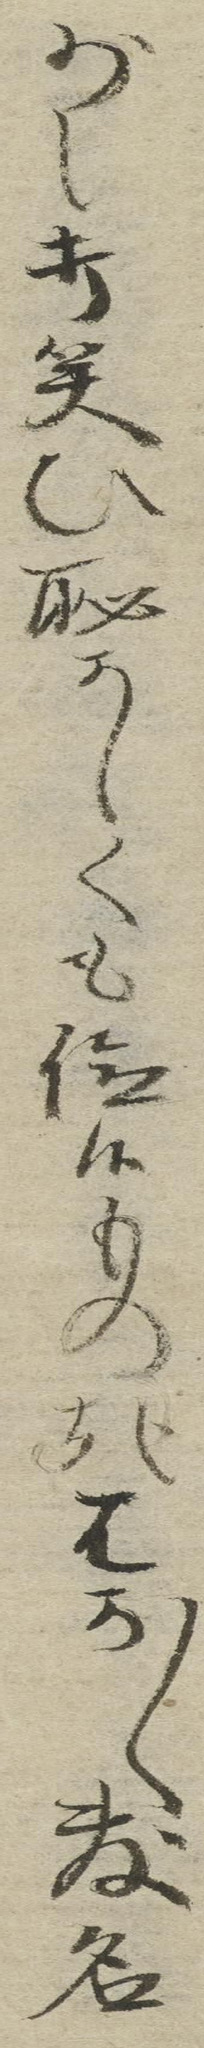少し打笑ひ恥かしくも仰候もの哉はな〳〵敷名
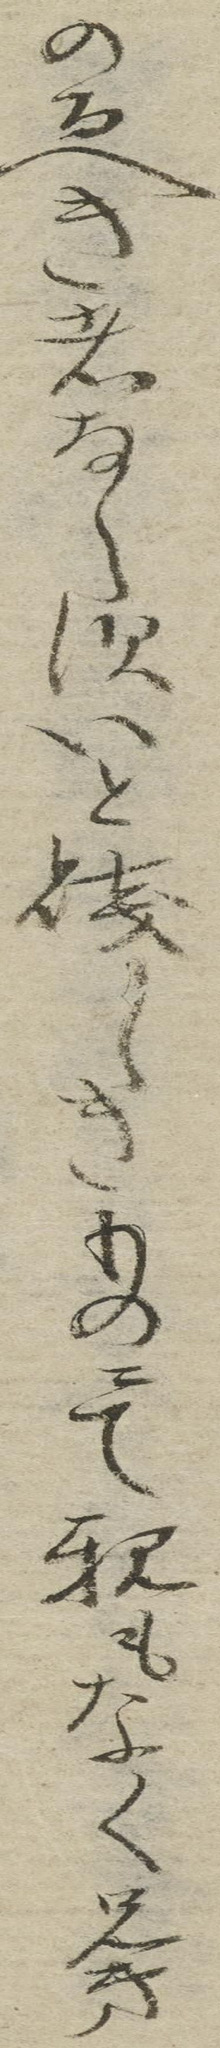のるへき者ならすいと賤しきものにて親もなく兄弟
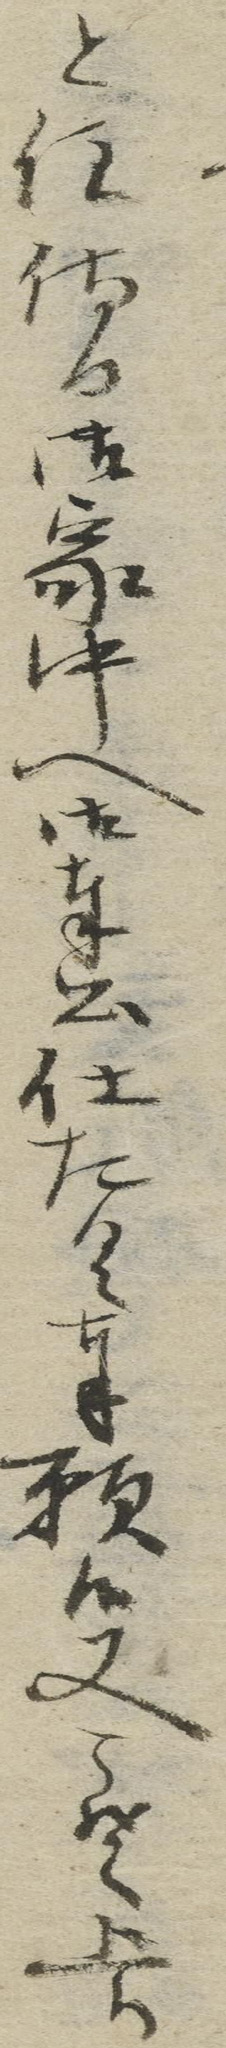と住さる御家中へ御奉公仕たく奉頼候又とぞ上り
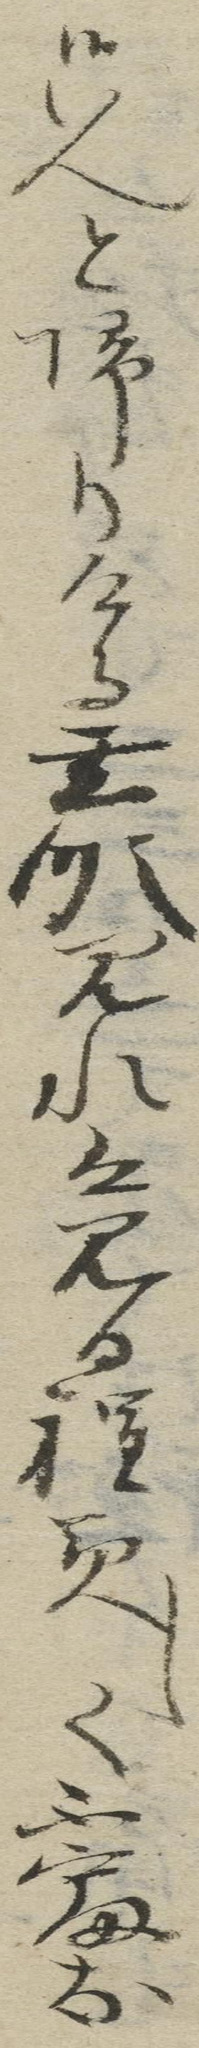候同人と帰りける玄順見れは見る程美しく不審な
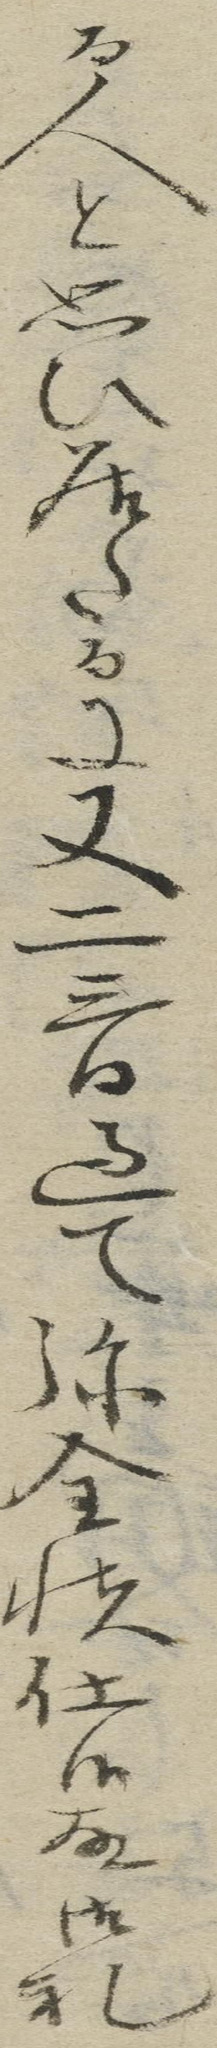る人と思ひ居たるに又二三日過て弥全快仕候故御礼
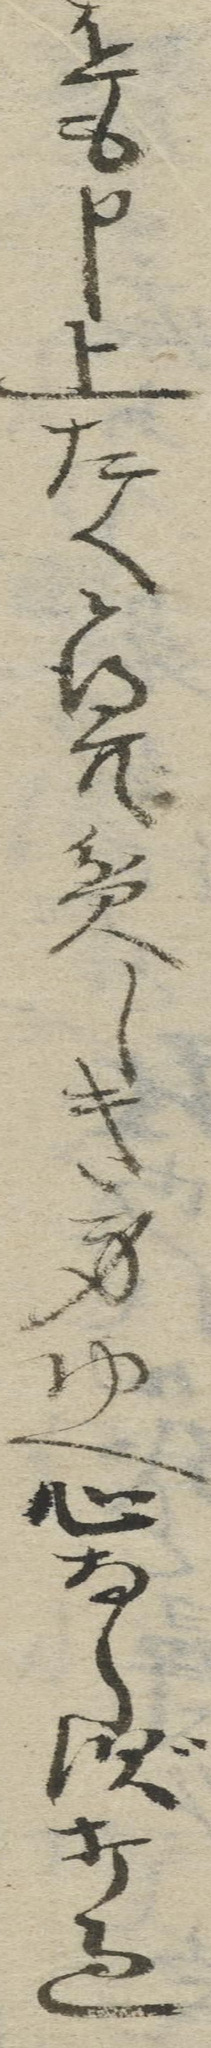をも申上たく候得共貧しき身ゆへ心ならず打過
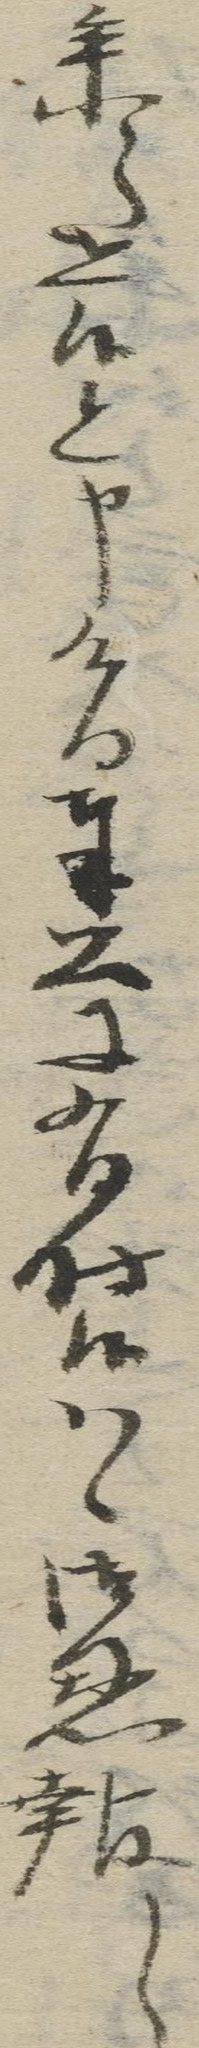参り出候と申ける奉公に有付候ハヽ御恩報し
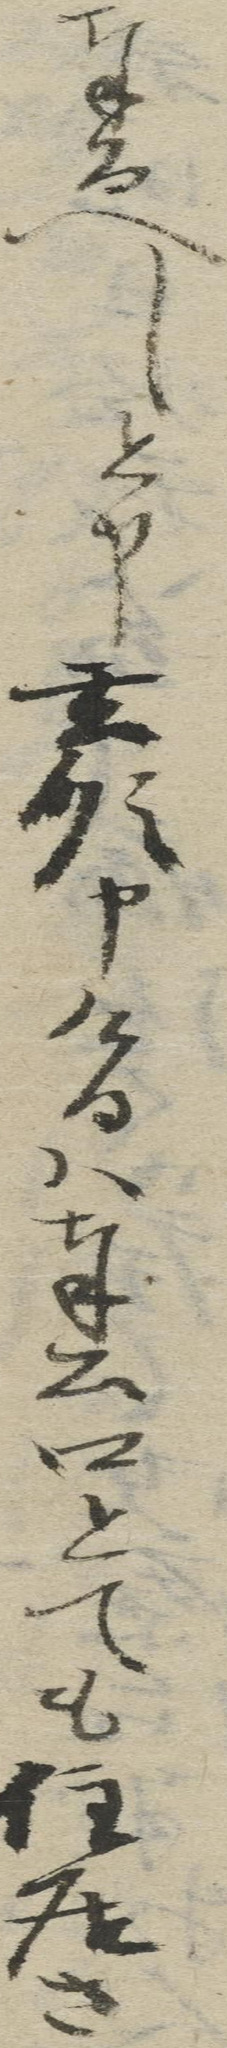奉るへしと申玄順申けるハ奉公口とても住居さ
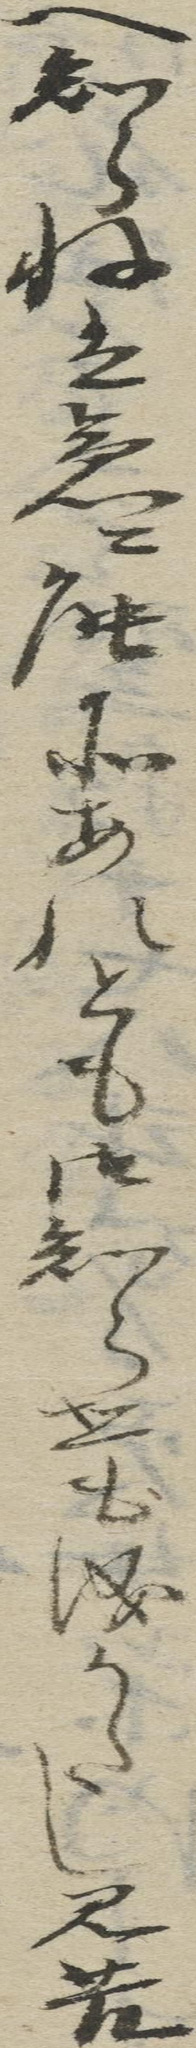へ知らねは急に能所あれとも御知らせも成かたし見苦
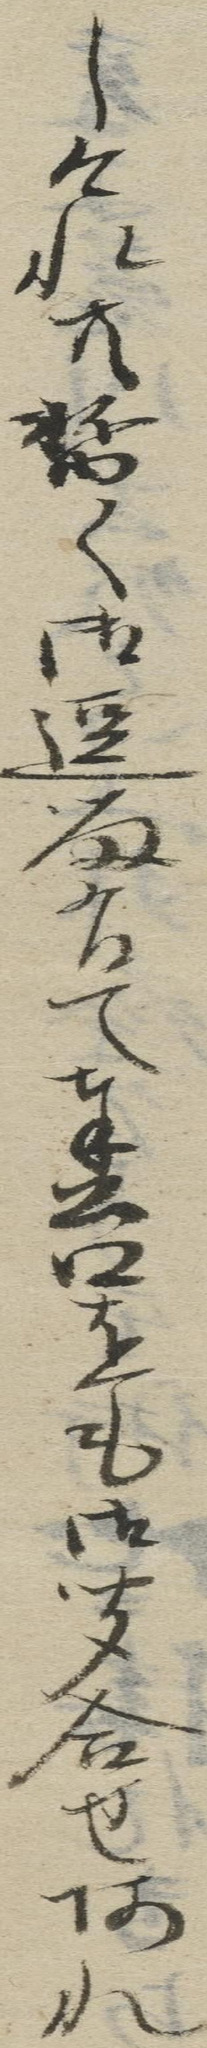しけれ共暫く御逗留有て奉公口をも御聞合せあれ
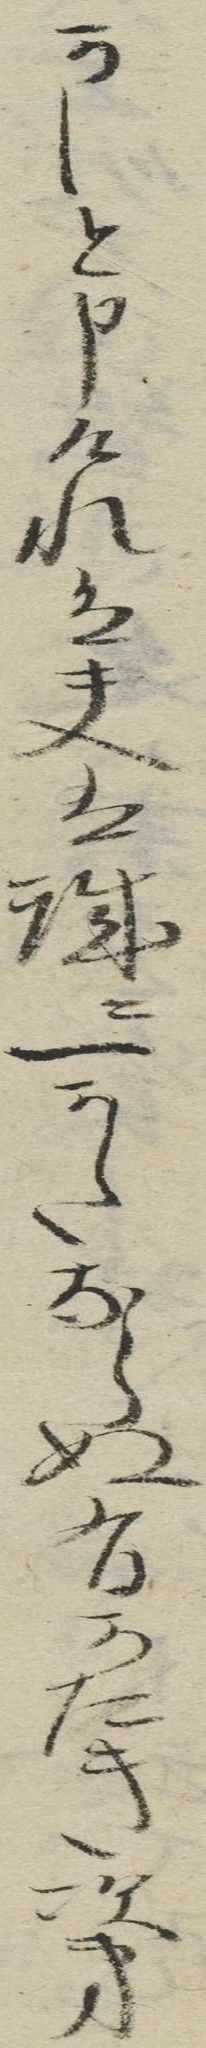かしと申けれは夫は殊に一かたならぬ有かたき次第
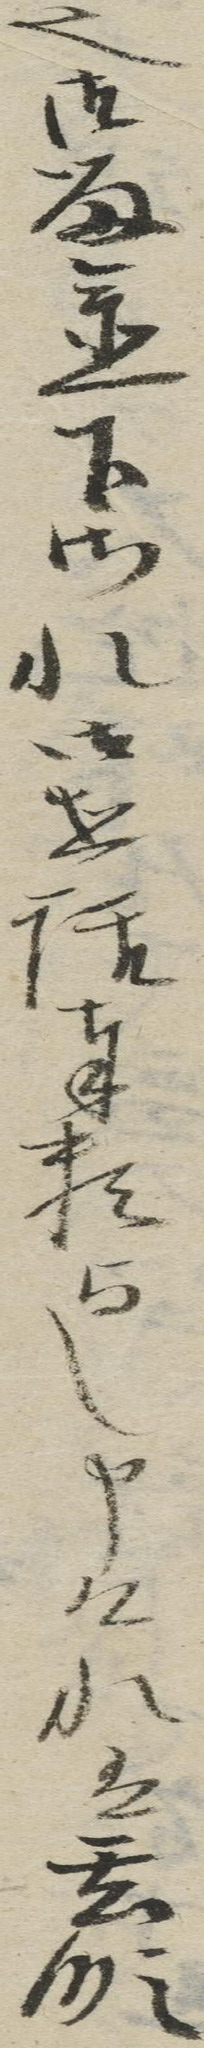也御留置下され御世話奉頼らし申けれは玄順
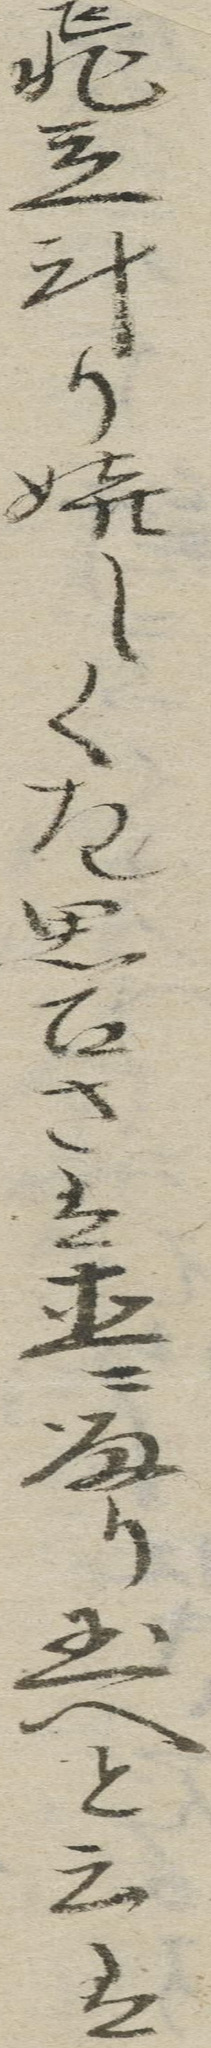飛立計り嬉しく左思召さは直ニ留り玉へと云は
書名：肥前國島原領普賢山大変記　完
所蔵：東京大学地震研究所図書室 Earthquake Research Institute Library, The University of Tokyo, JAPAN
